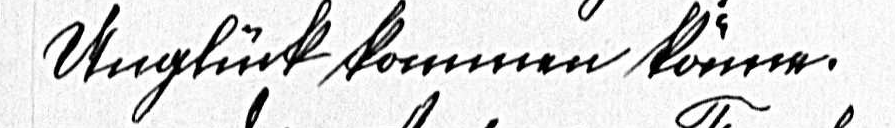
Unglück kommen könne.
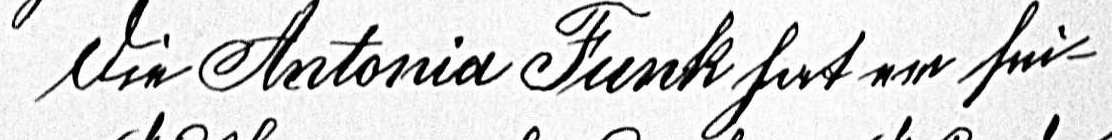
Die Antonia Funk hat er sei¬
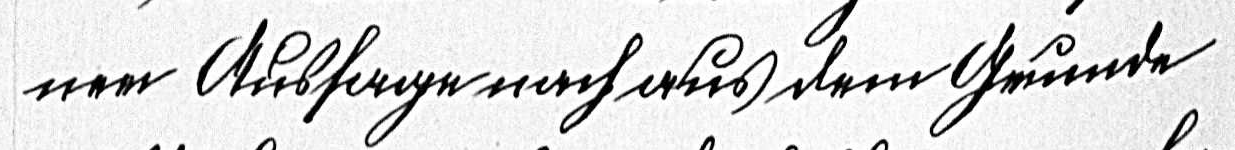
ner Aussage nach aus dem Grunde
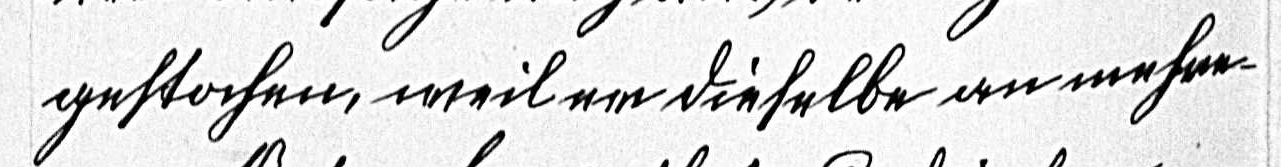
gestochen, weil er dieselbe an mehre¬
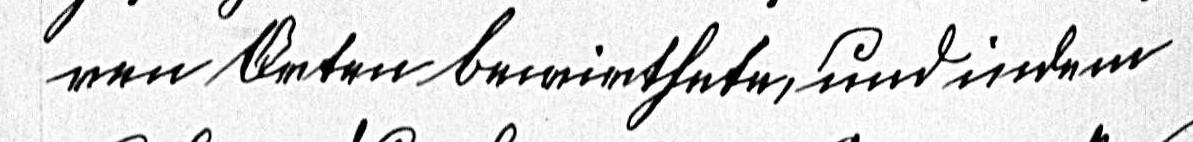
ren Orten bewirthete, und indem
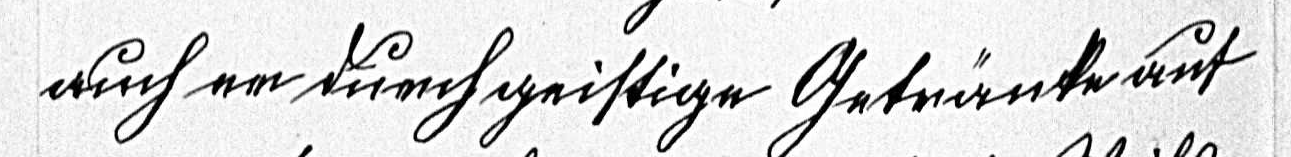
auch er durch geistige Getränke auf¬
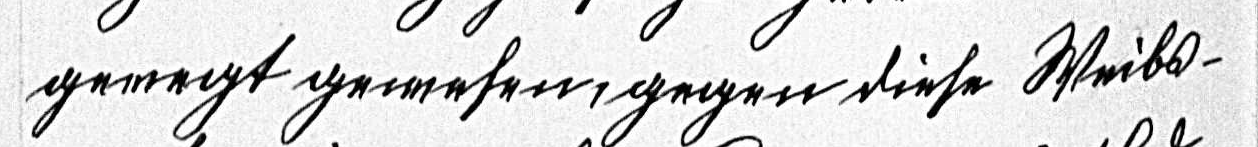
geregt gewesen, gegen diese Weibs¬
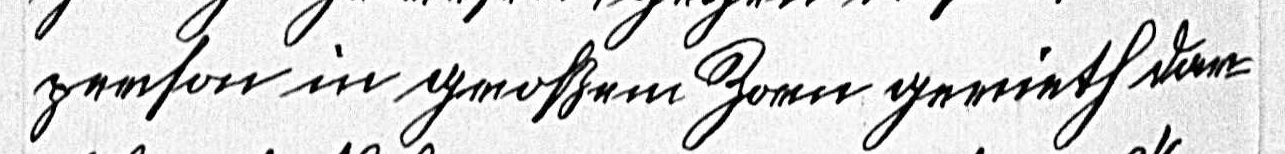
person in großem Zorn geriet dar¬
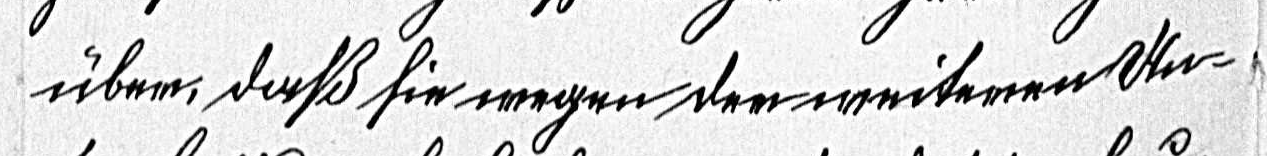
über, daß sie wegen der weiteren Un¬
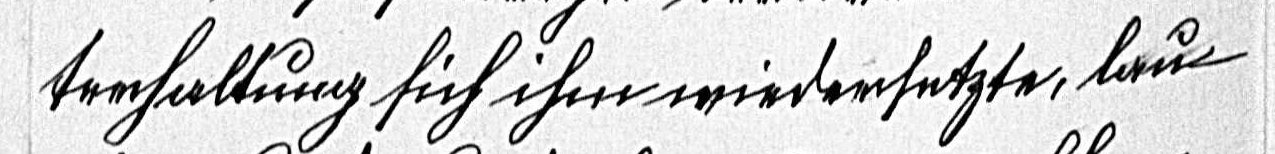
terhaltung sich ihm widersetzte, lau¬
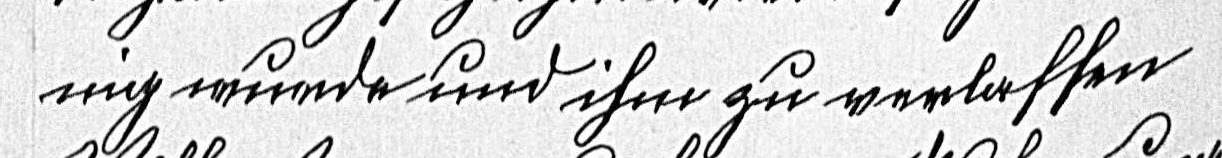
nig wurde und ihm zu verlassen
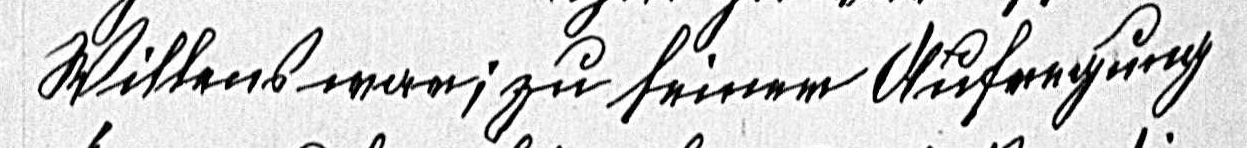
Willens war; zu seiner Aufregung
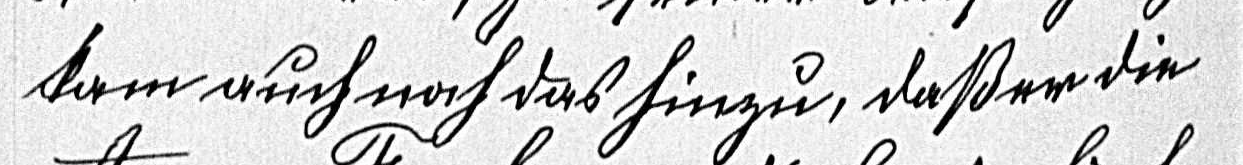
kam auch noch das hinzu, daß er die
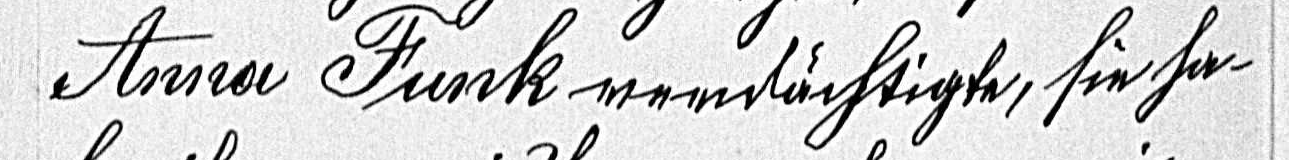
Anna Funk verdächtigt, sie ha¬
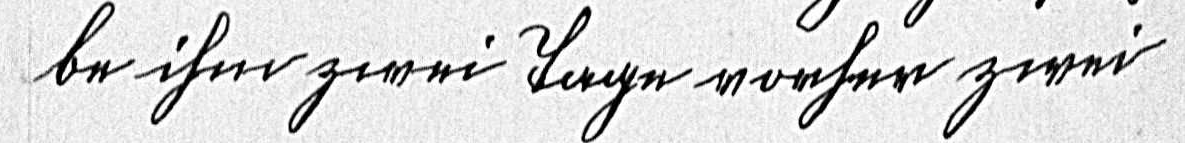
be ihm zwei Tage vorher zwei
